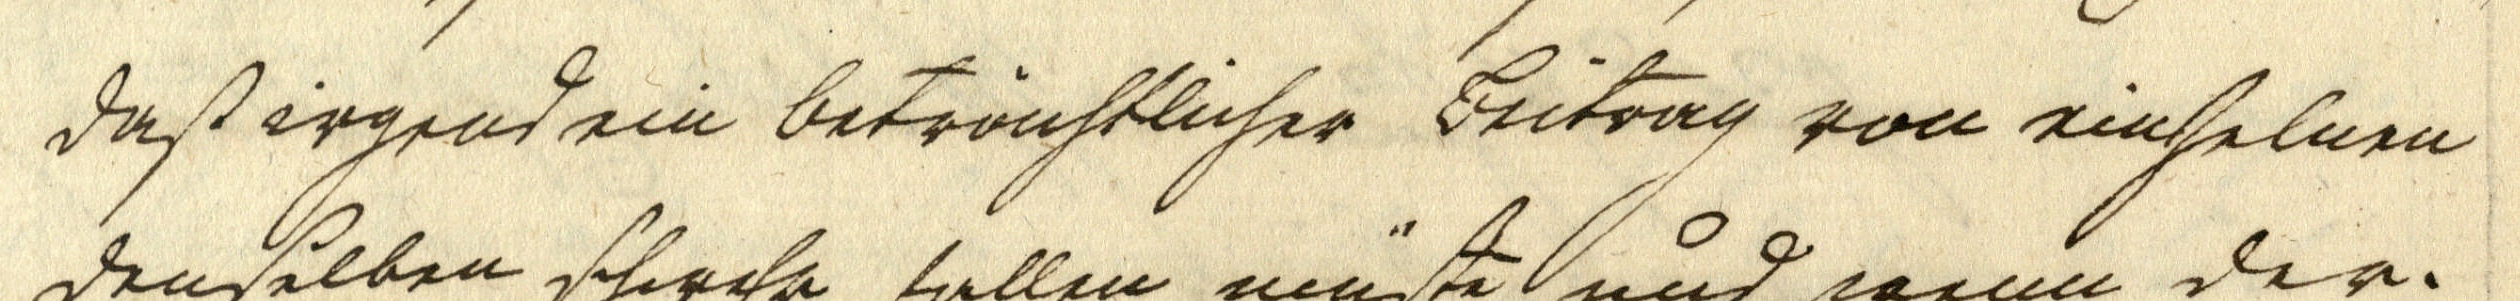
daß irgend ein beträchtlicher Beitrag von einzelnen
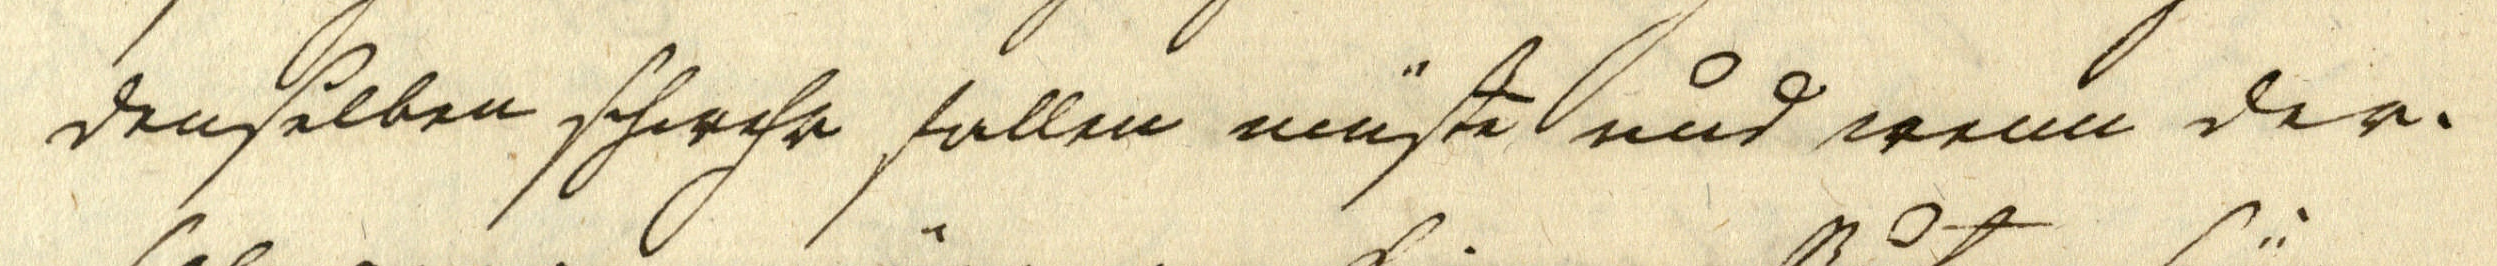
denselben schwehr fallen müßte und wenn der-
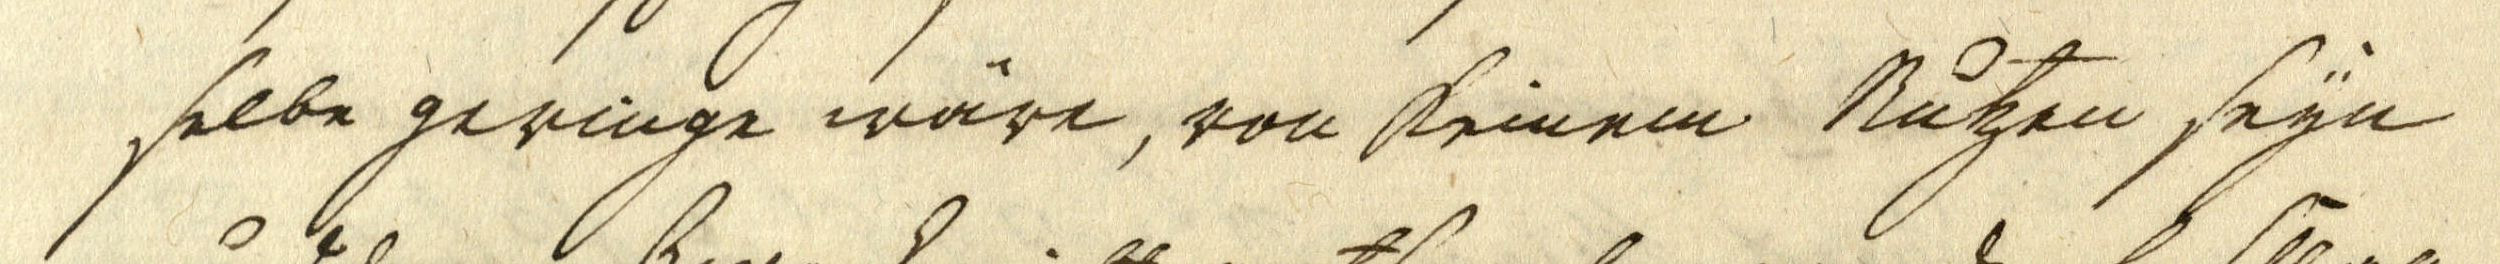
selbe geringe wäre, von keinem Nutzen seyn
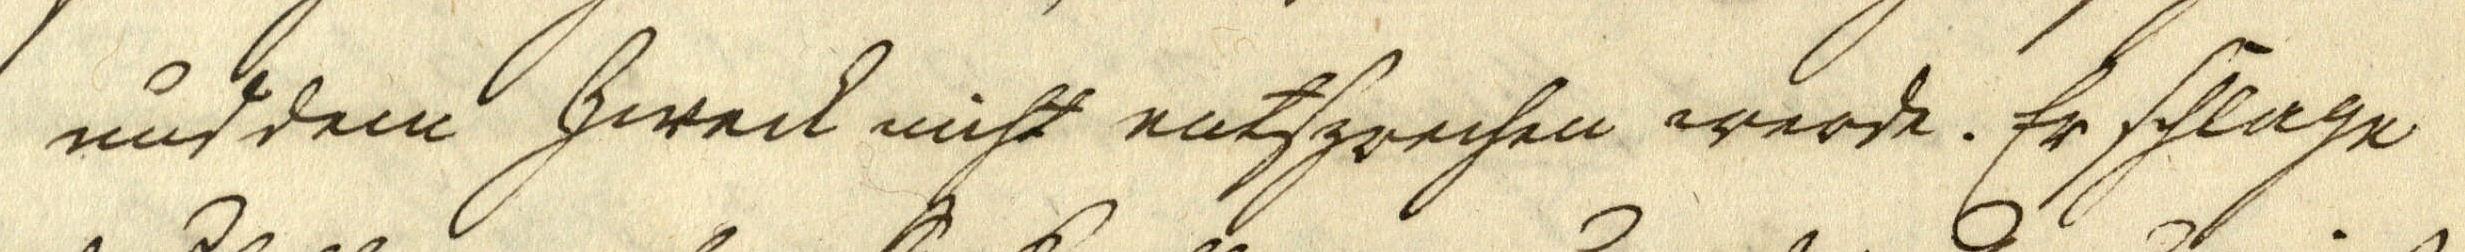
und dem Zweck nicht entsprechen werde. Er schlage
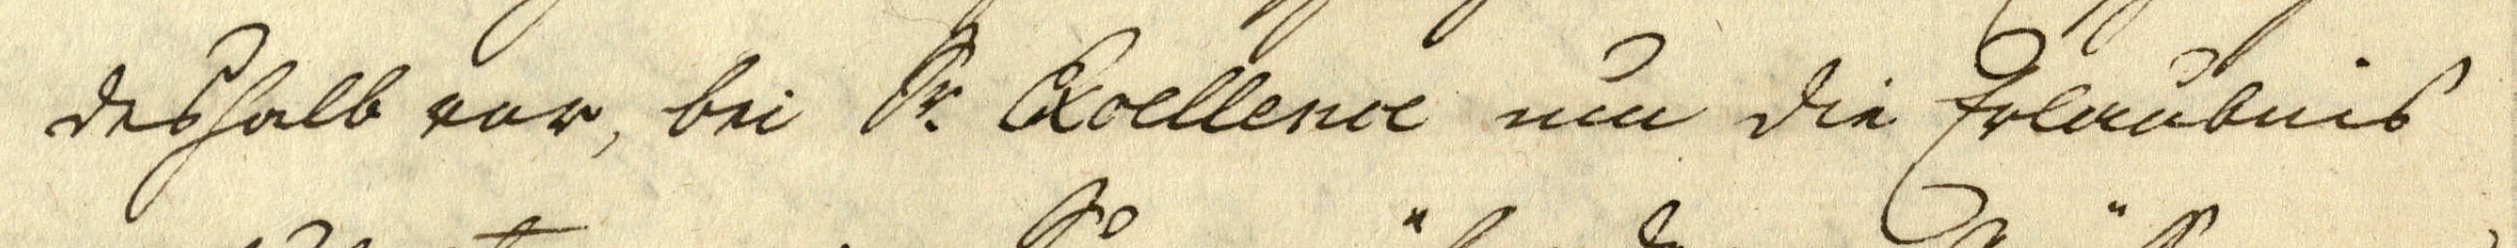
deshalb vor, bei Sr. Excellence um die Erlaubnis
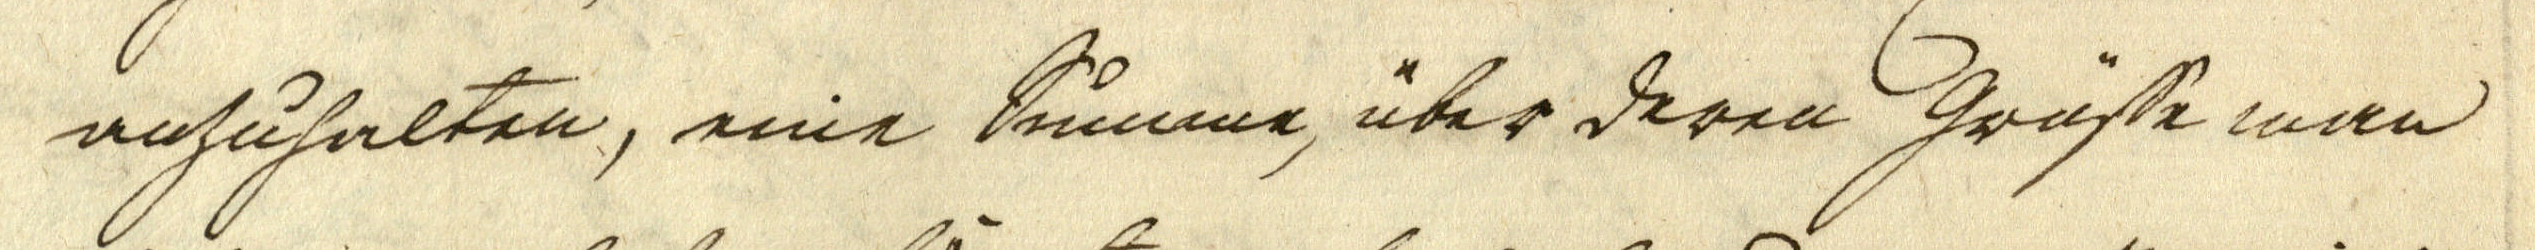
anzuhalten, eine Summe, über deren Grösse man
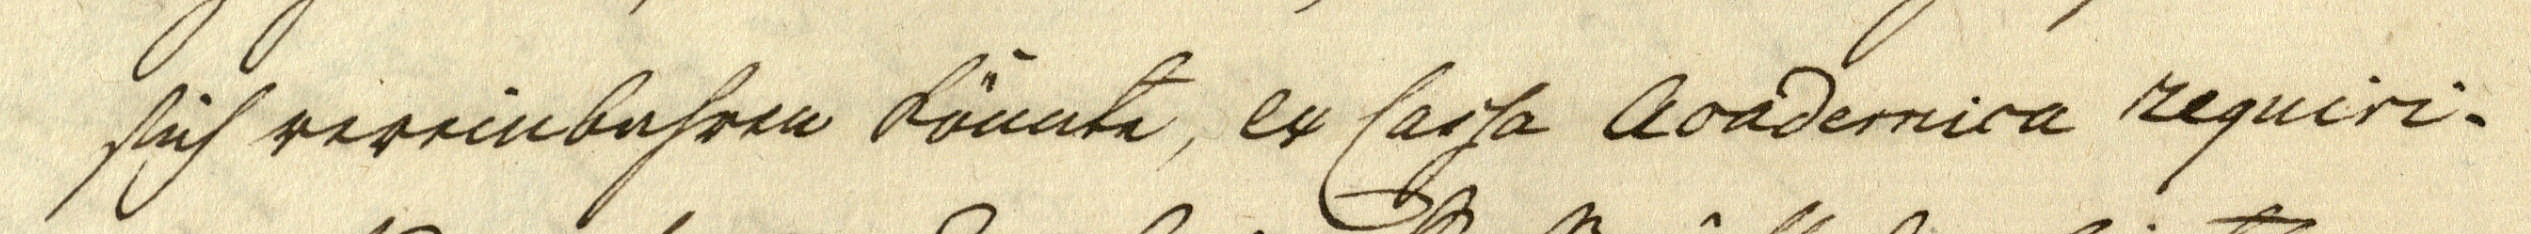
sich vereinbahren könnte, ex Cassa Academica requiri-
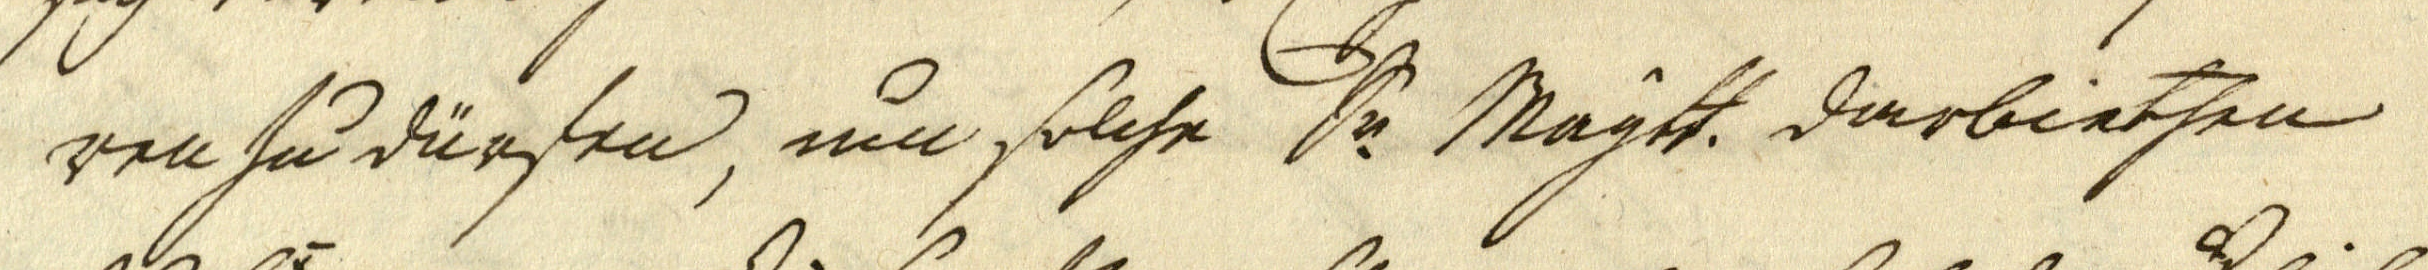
ren zu dürfen, um solche Sr. Maytt. darbiethen
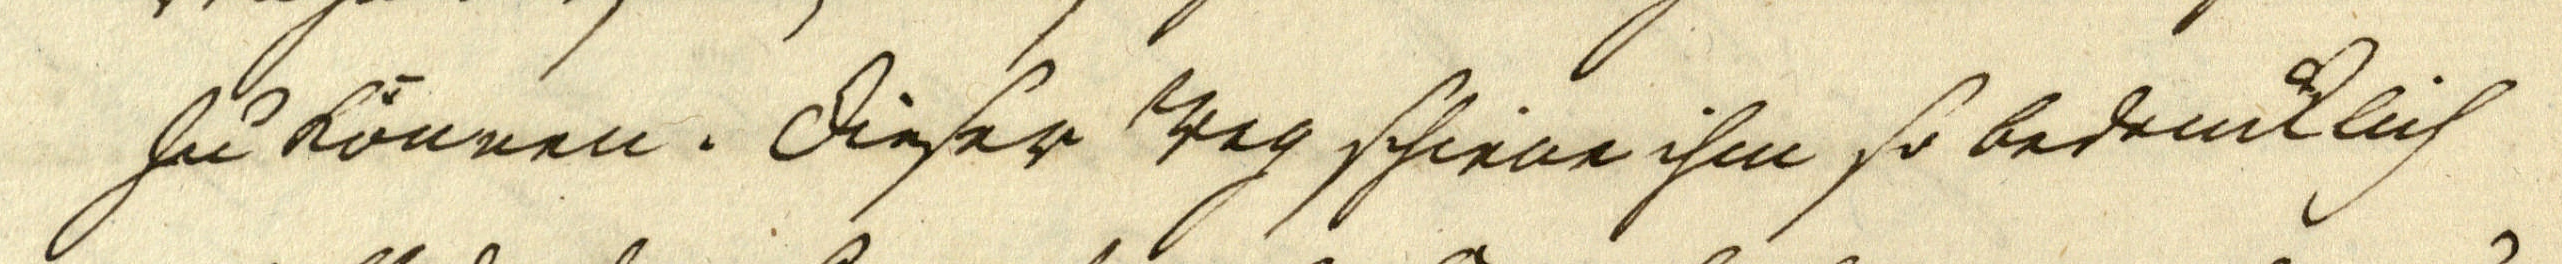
zu können. Dieser Weg schiene ihm so bedenklich
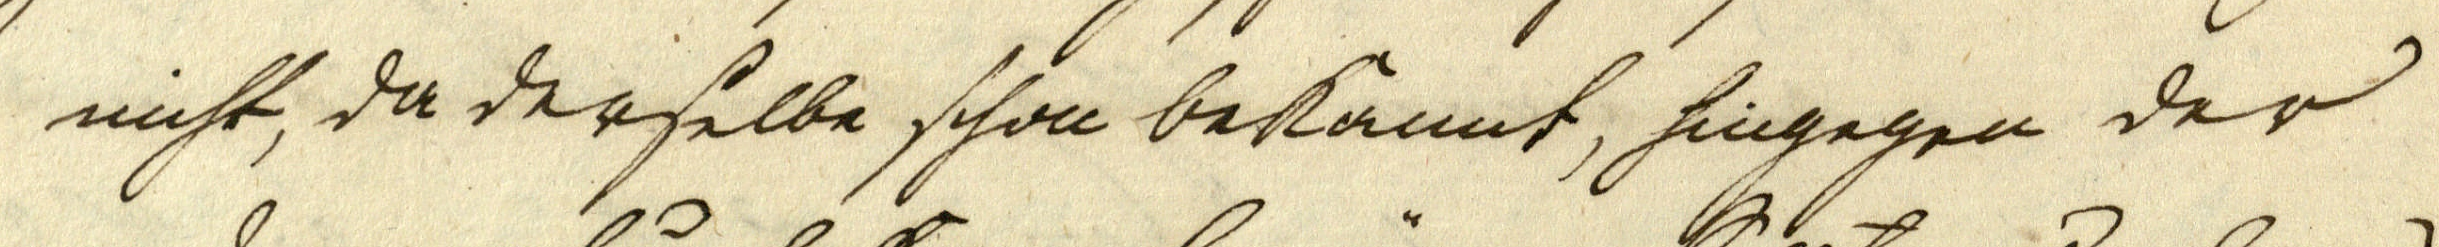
nicht, da derselbe schon bekannt, hingegen der
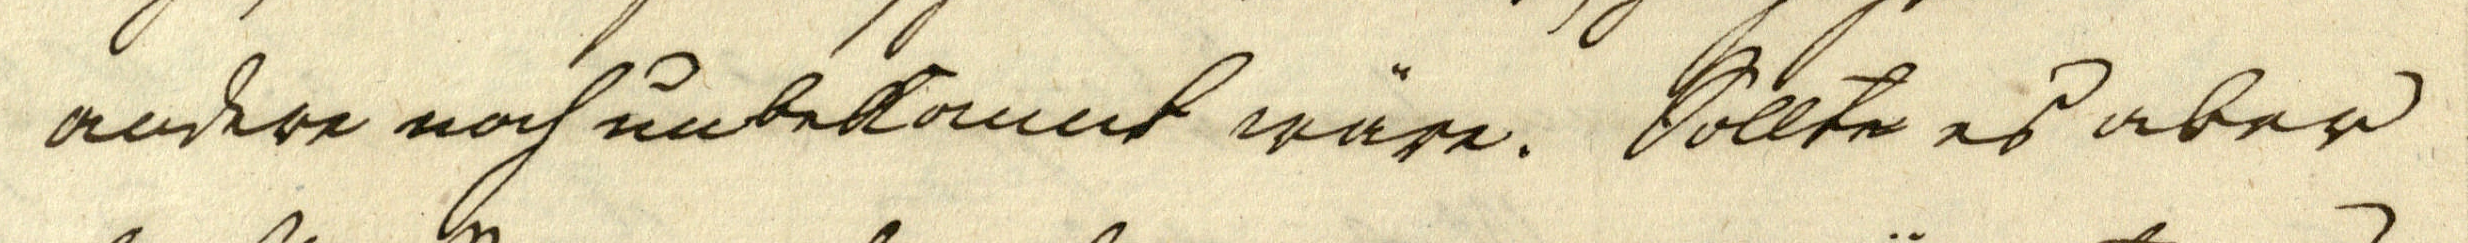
andere noch unbekannt wäre. Sollte es aber
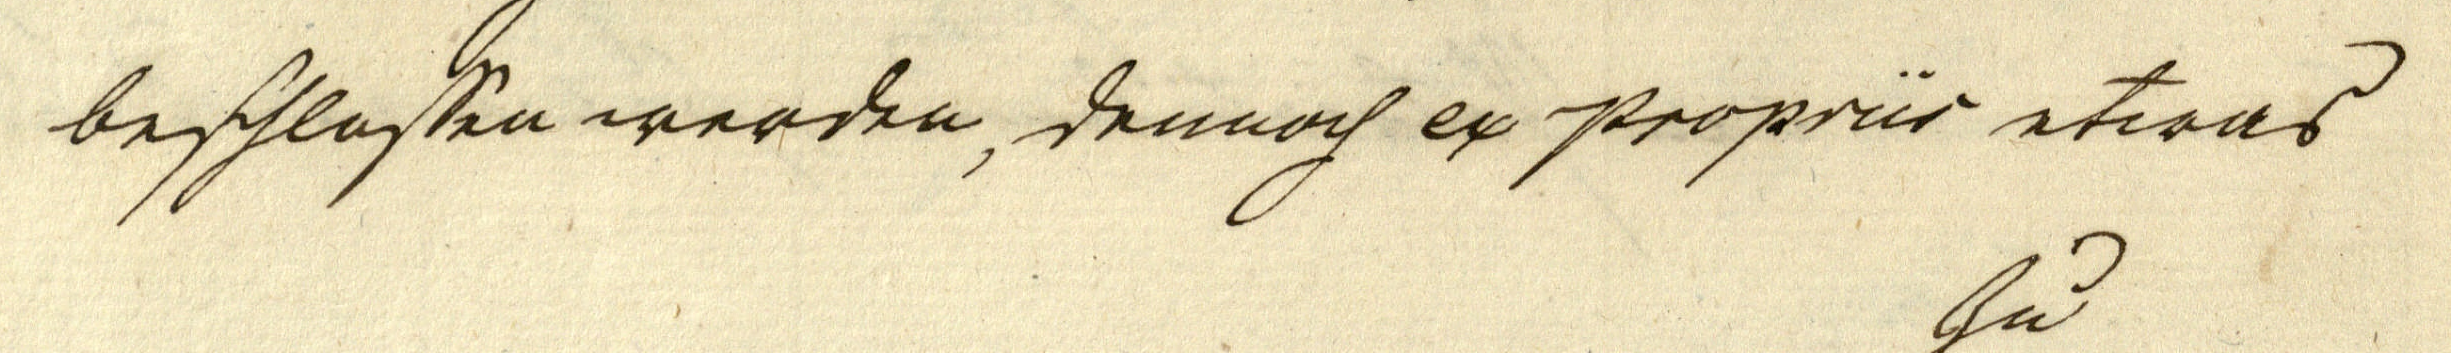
beschlossen werden, dennoch ex propriis etwas
